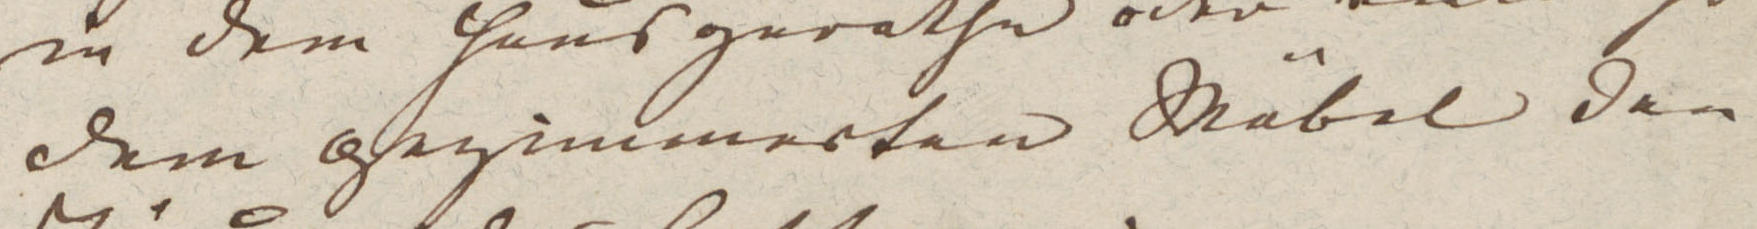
dem gezimmerten Möbel den
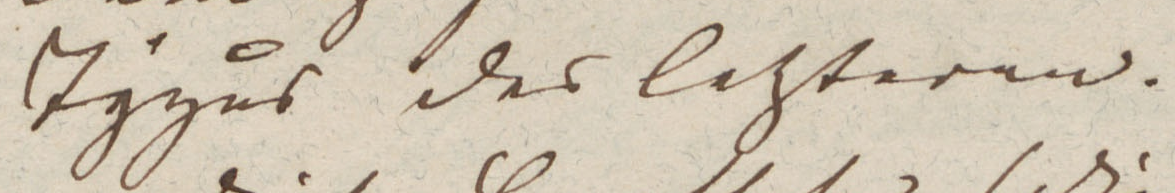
Typus des letzteren.
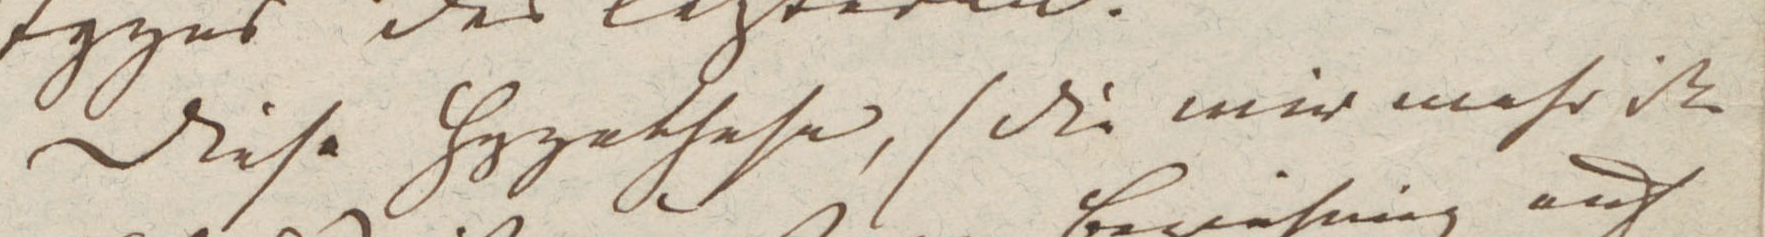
Diese Hypothese, (die mir mehr ist
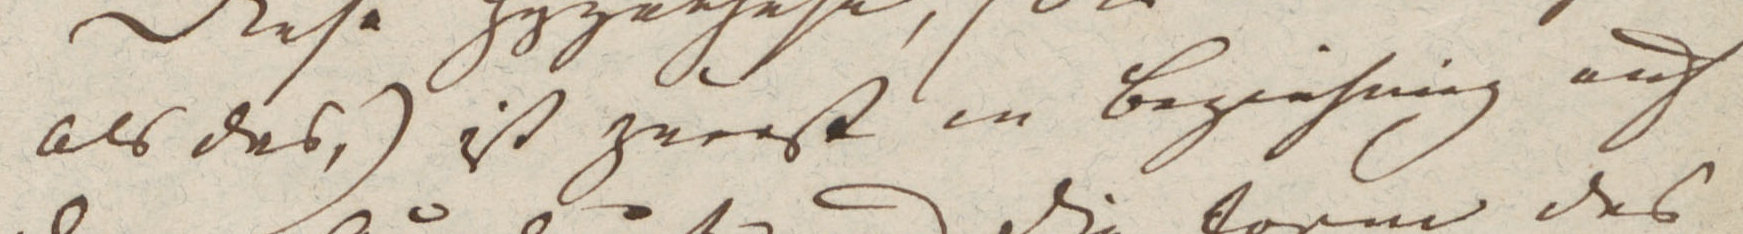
als das,) ist zuerst in Beziehung auf
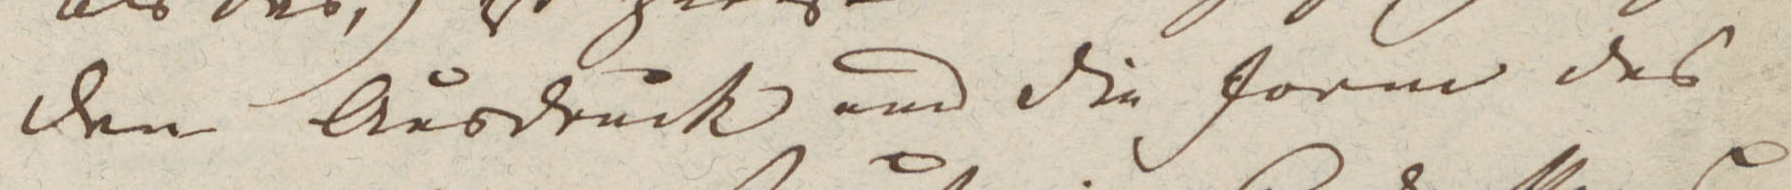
den Ausdruck und die Form des
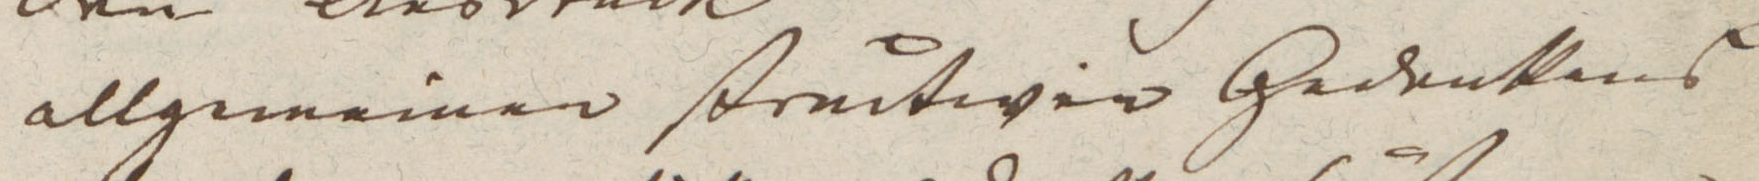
allgemeinen structiven Gedankens
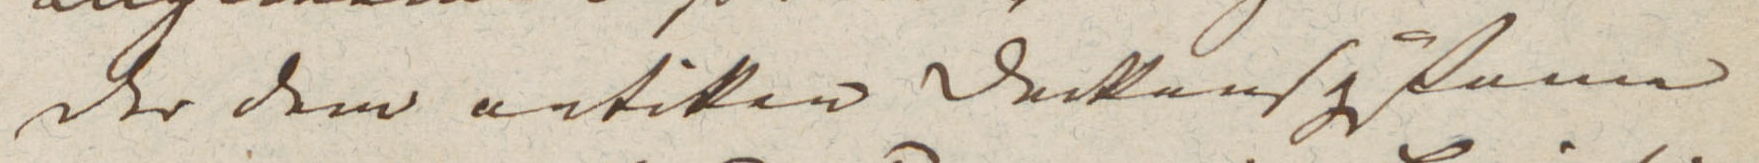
der dem antiken Deckensysteme
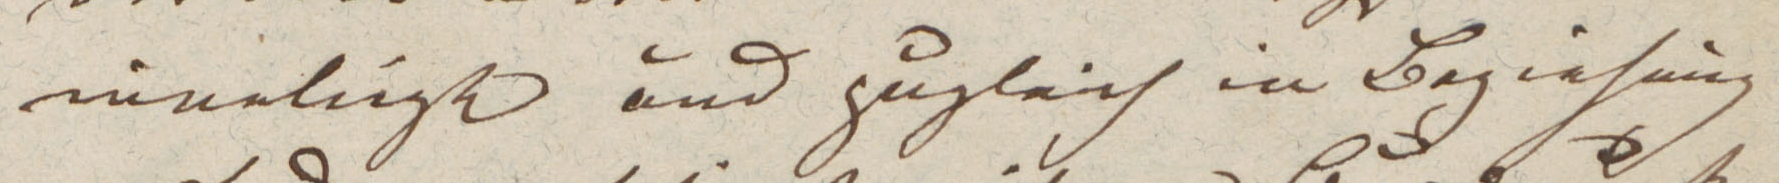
inneliegt und zugleich in Beziehung
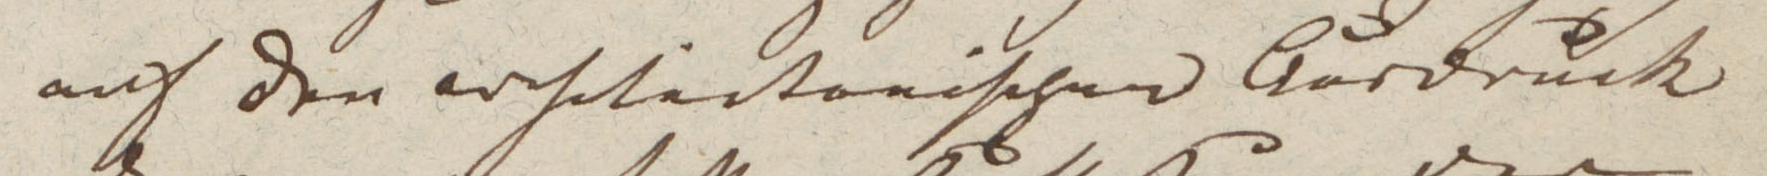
auf den architectonischen Ausdruck
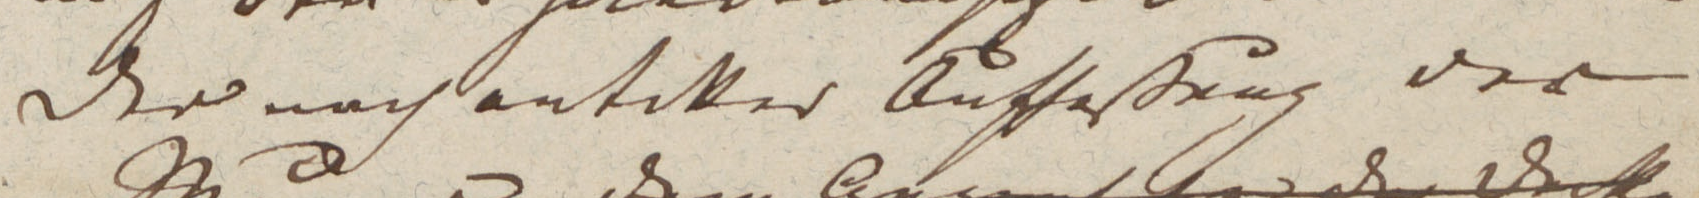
der nach antiker Auffassung der
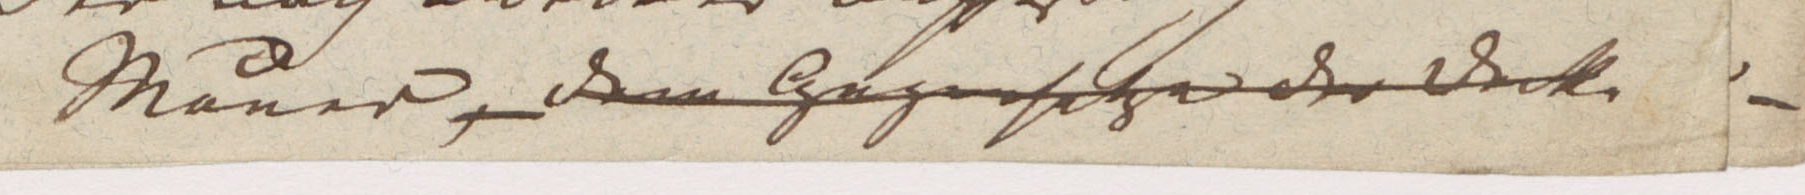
Mauer, dem Gegensatze der Decke
